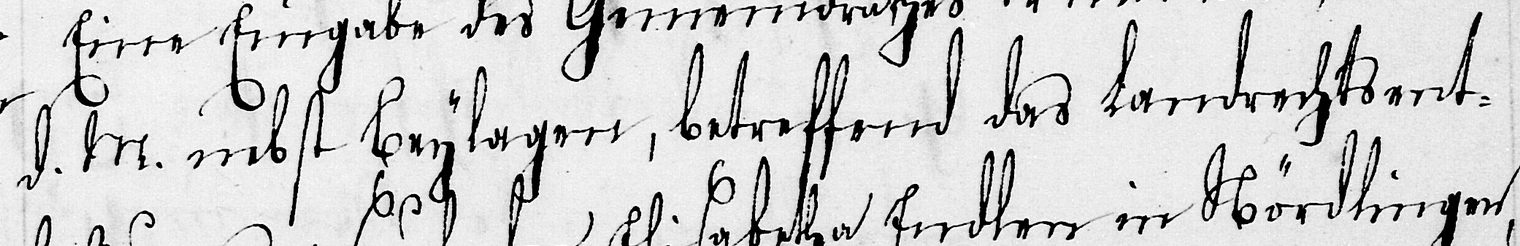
d. M. nebst Beylagen, betreffend das Landrechtsent¬
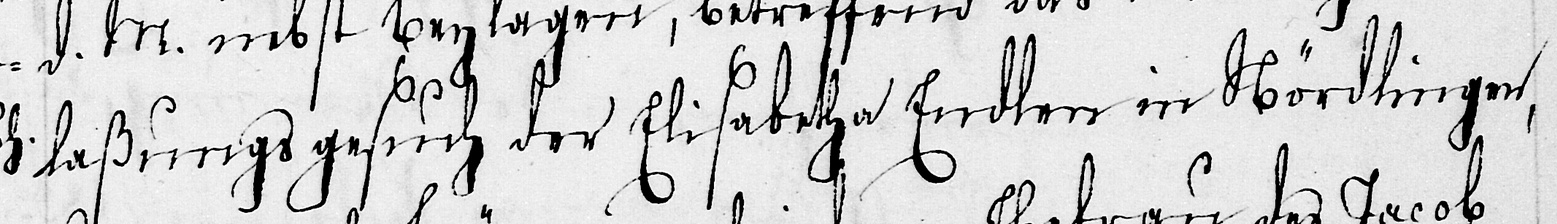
laßungsgesuch der Elisabetha Endlen in Nördlingen,
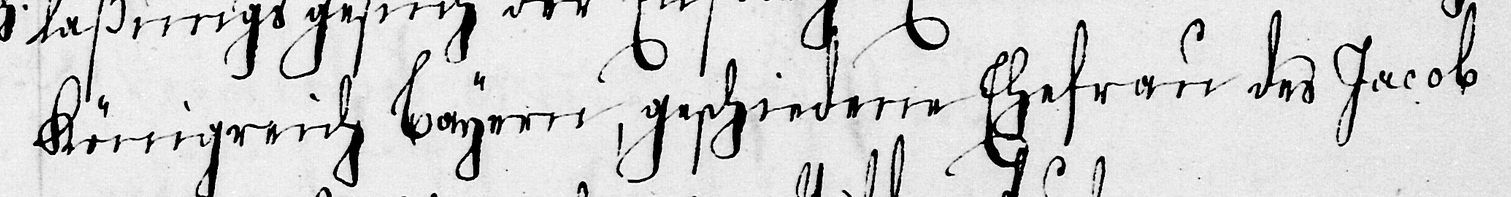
Königreich Bayern, geschiedene Ehefrau des Jacob
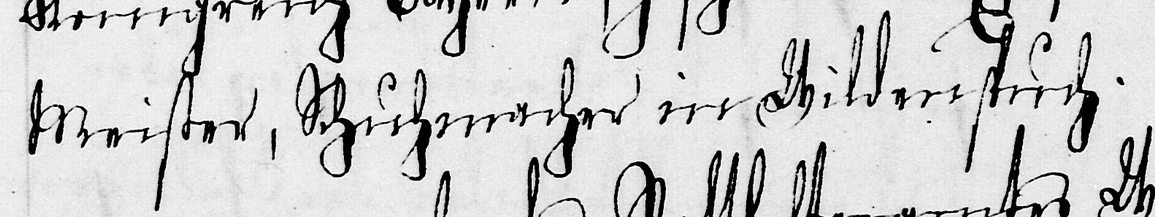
Meister, Schuhmacher in Wildenspuch.
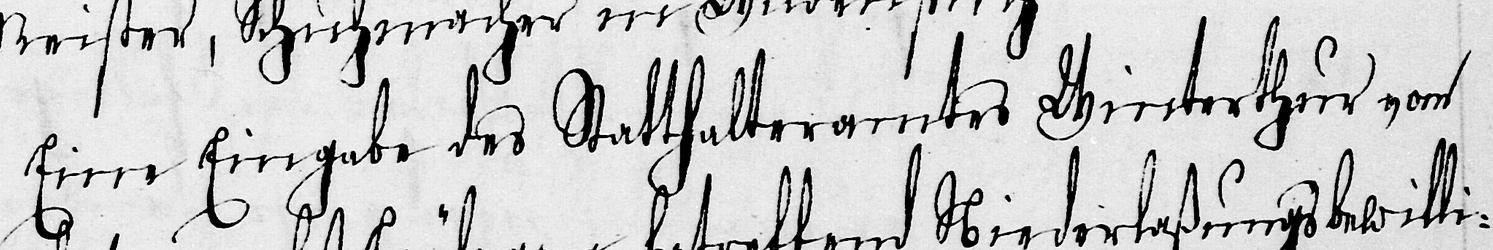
Eine Eingabe des Statthalteramtes Winterthur vom
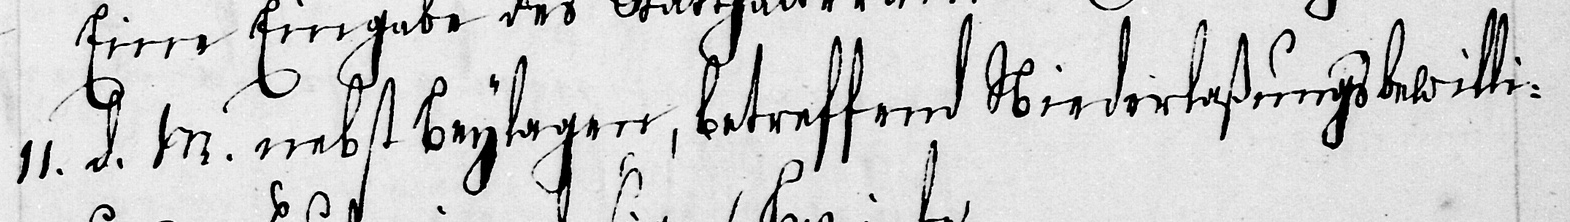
d. M. nebst Beylagen, betreffend Niederlaßungsbewilli¬
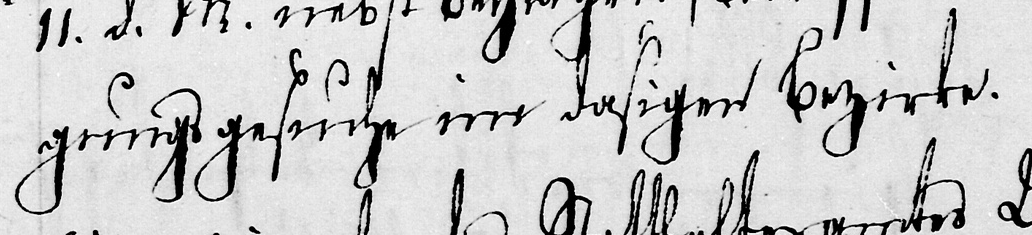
gungsgesuche im dasigen Bezirke.
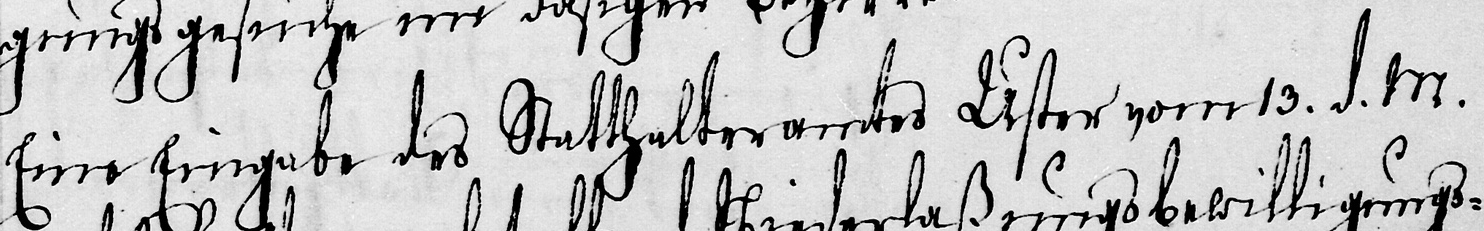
Eine Eingabe des Statthalteramtes Uster vom 13. d. M.
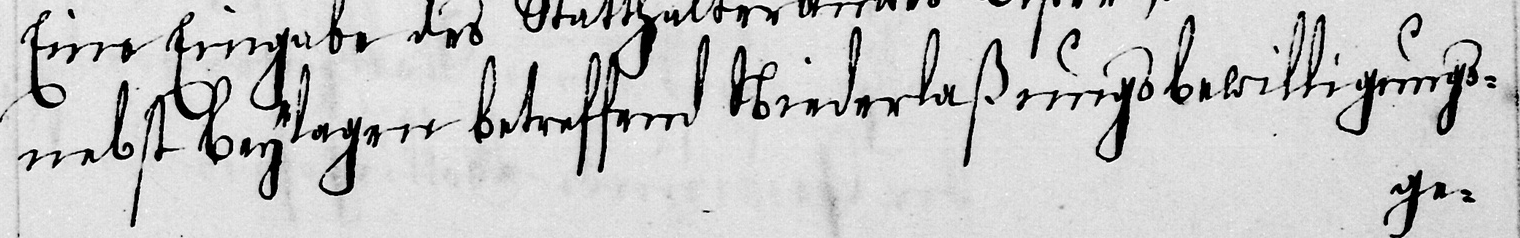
nebst Beylagen betreffend Niederlaßungsbewilligungs-
